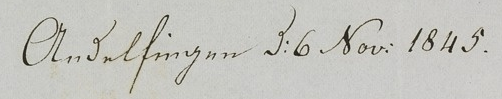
Andelfingen d: 6 Nov: 1845.
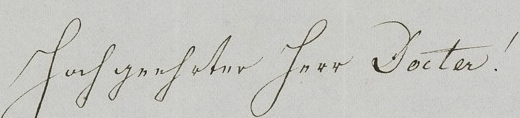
Hochgeehrter Herr Docter!
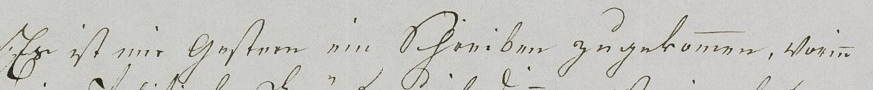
Es ist mir Gestern ein Schreiben zugekommen, worinn
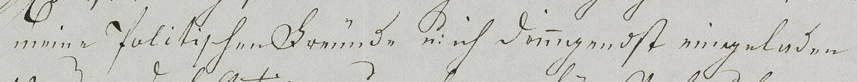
meine Politischen Freunde &: ich drinngendst eingeladen
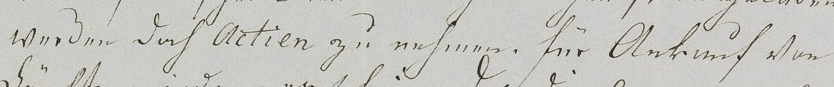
werden doch Actien zu nehmen, für Ankauf von
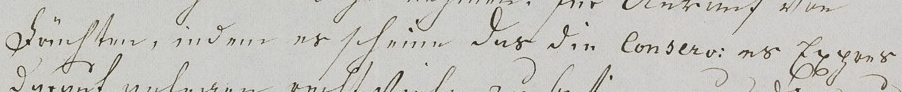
Früchten, indem es scheine das die Conserv : es Expres
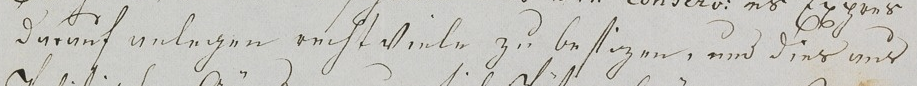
darauf anlegen recht viele zu besizen, und dies aus
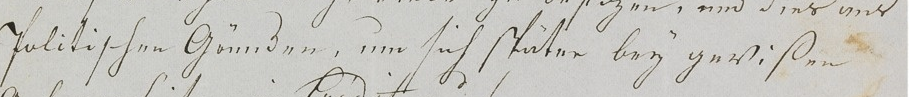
Politischen Gründen, um sich später bey gewissen
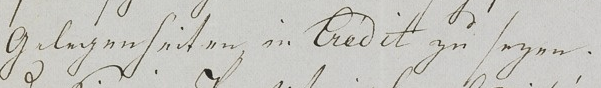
Gelegenheiten in Crédit zu sezen.
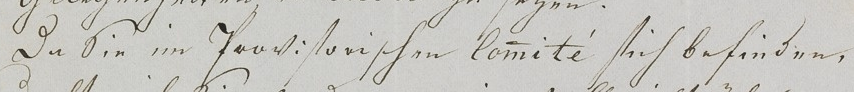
Da Sie im Provisorischen Commité sich befinden,
